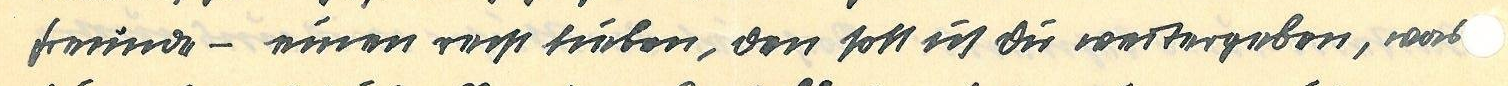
Freunde – einem recht lieben, den soll ich Dir weitergeben, was
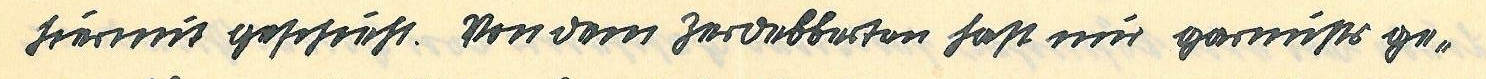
hiermit geschieht. Von dem Zerdebberten hast mir gar nichts ge¬
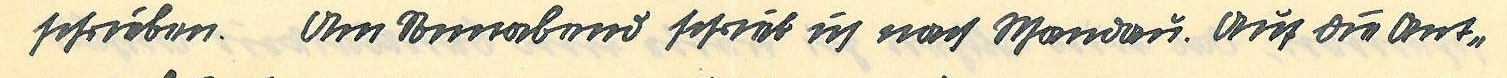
schrieben. Am Sonnabend schrieb ich nach S. Auf die Ant¬
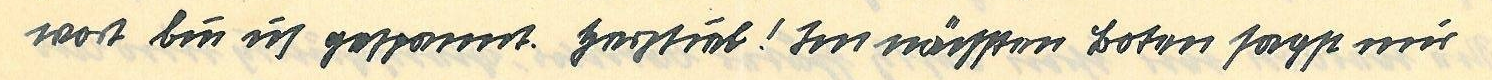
wort bin ich gespannt. Herzlieb! Im nächsten Boten sagst mir
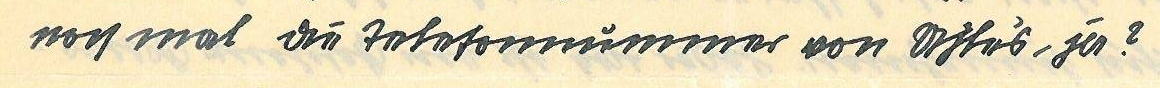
noch mal die Telefonnummer von S.’s, ja?
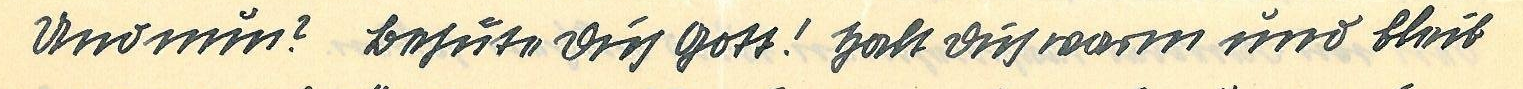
Und nun? Behüte Dich Gott! Halt Dich warm und bleib
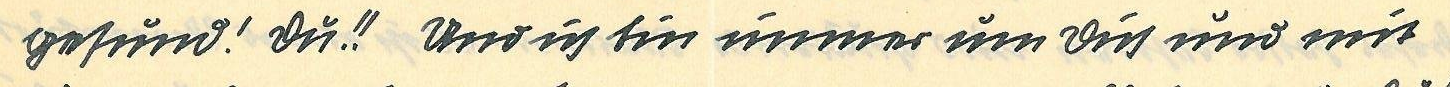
gesund! Du!! Und ich bin immer um Dich und mit
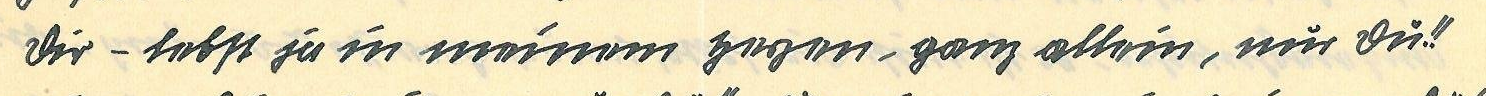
Dir – lebst ja in meinem Herzen, ganz allein, nur Du!!
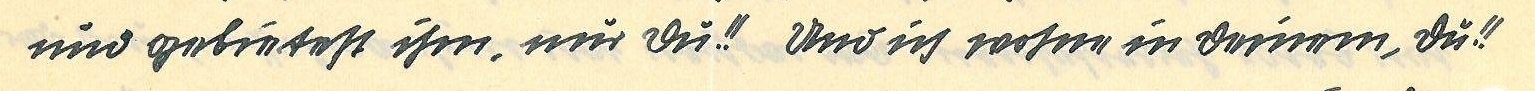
und gebietest ihm, nur Du!! Und ich wohne in Deinem, Du!!
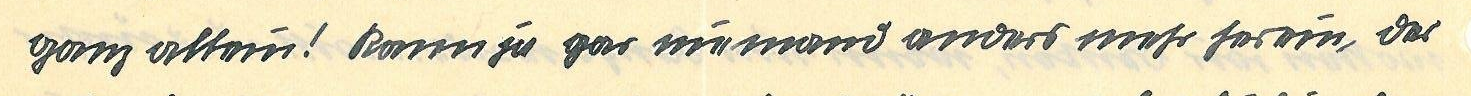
ganz allein! Kann ja gar niemand anders mehr herein, der
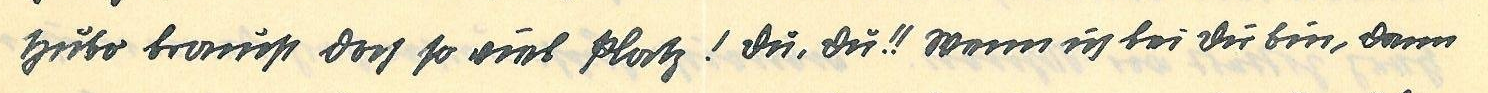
Hubo braucht doch so viel Platz! Du, Du!! Wenn ich bei Dir bin, dann
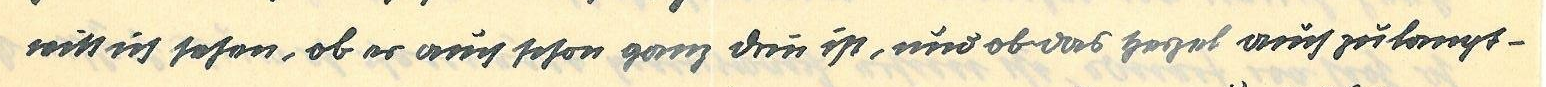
will ich sehen, ob er auch schon ganz drin ist, und ob das Herzl auch zulangt –
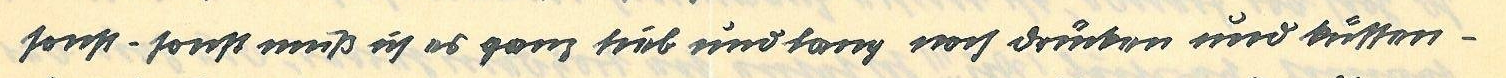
sonst – sonst muss ich es ganz lieb und lang noch drücken und küssen –
